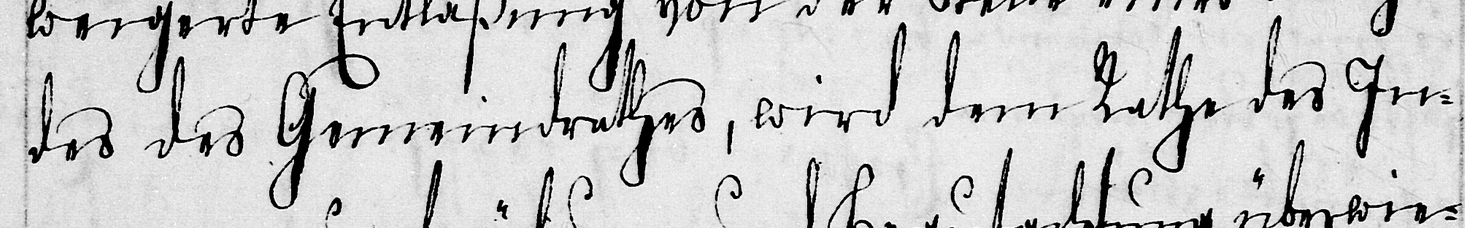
des des Gemeindrathes, wird dem Rathe des In¬
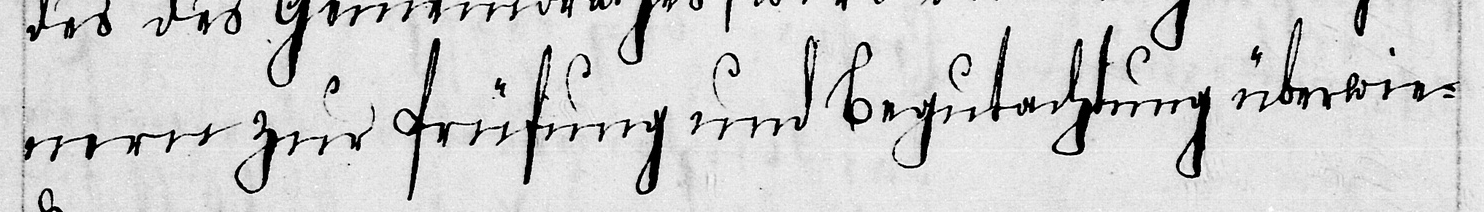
nern zur Prüfung und Begutachtung überwie¬
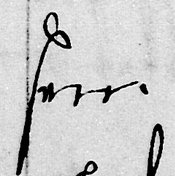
sen.
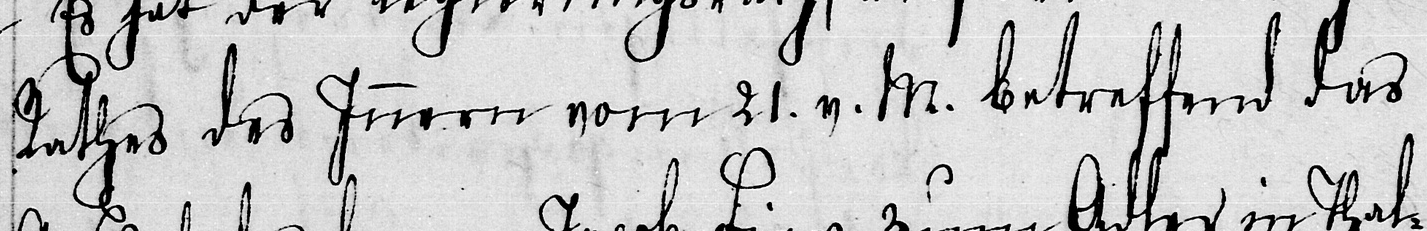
Rathes des Innern vom 21. v. M. betreffend das
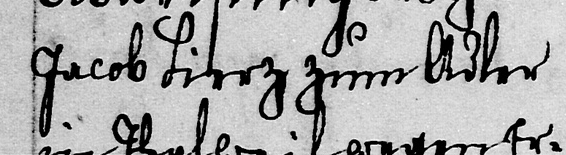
Jacob Fierz zum Adler
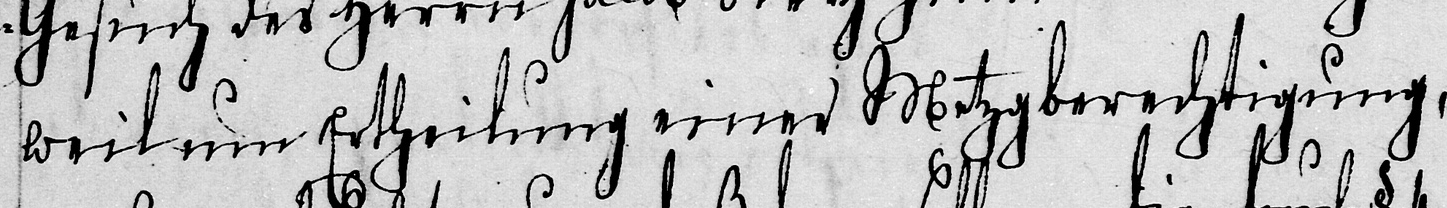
weil um Ertheilung einer Metzgberechtigung,
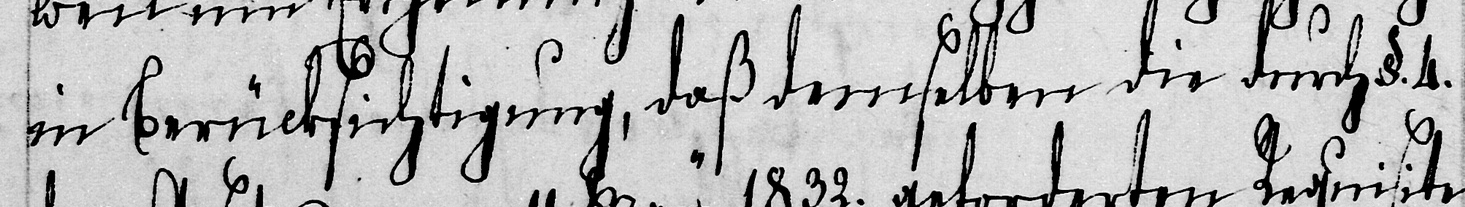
in Berücksichtigung, daß demselben die durch §.
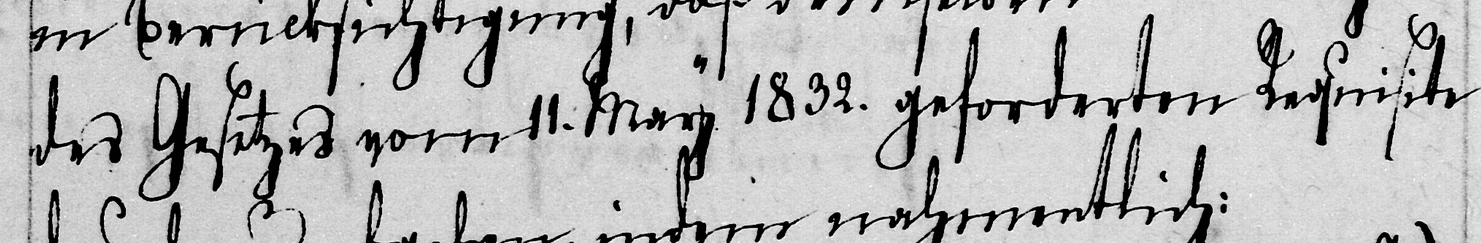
des Gesetzes vom 11. May 1832. geforderten Requisite
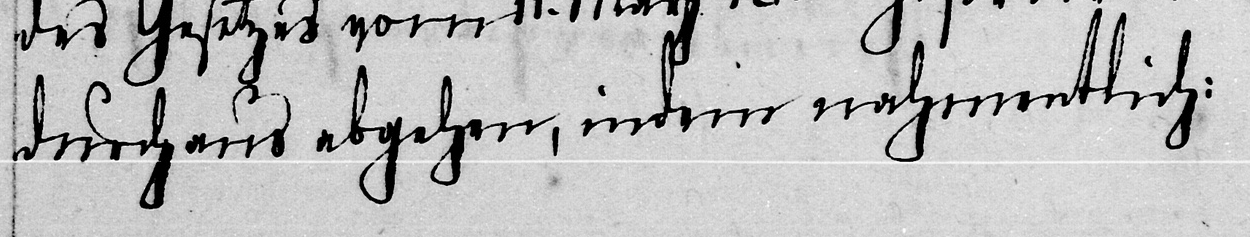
durchaus abgehen, indem nahmentlich:
